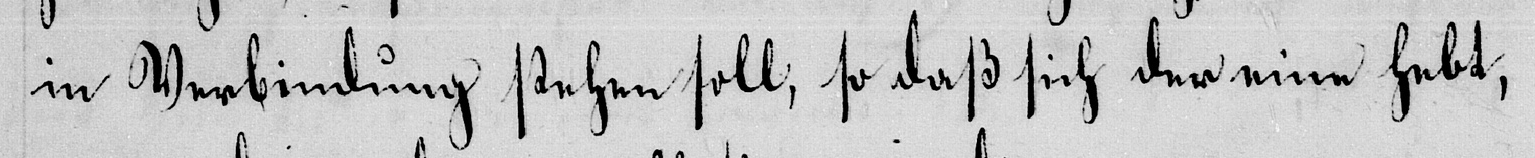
in Verbindung stehen soll, so daß sich der eine hebt,
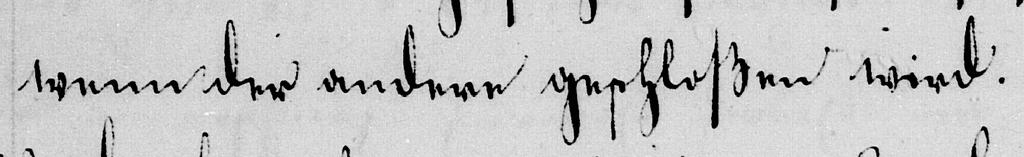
wenn der andere geschloßen wird.
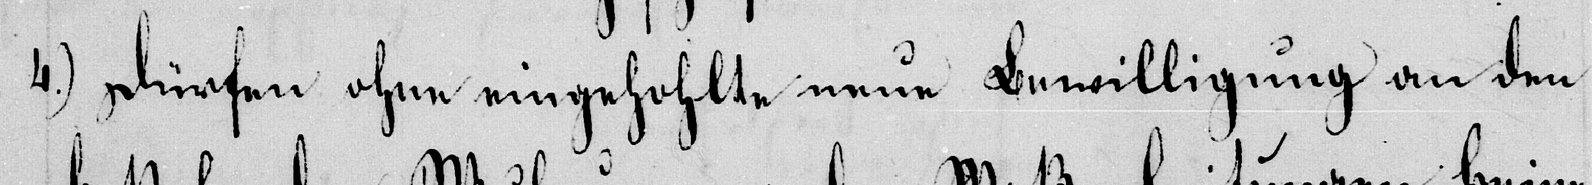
4.) Dürfen ohne eingehohlte neue Bewilligung an den
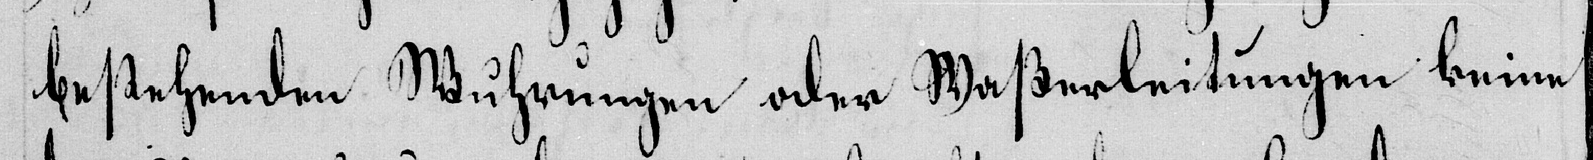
bestehenden Wuhrungen oder Waßerleitungen keine
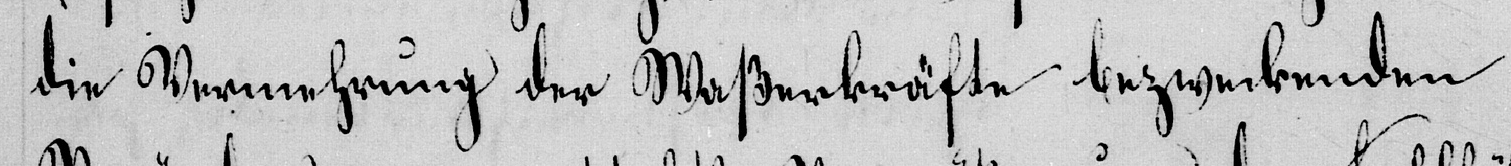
die Vermehrung der Waßerkräfte bezweckenden
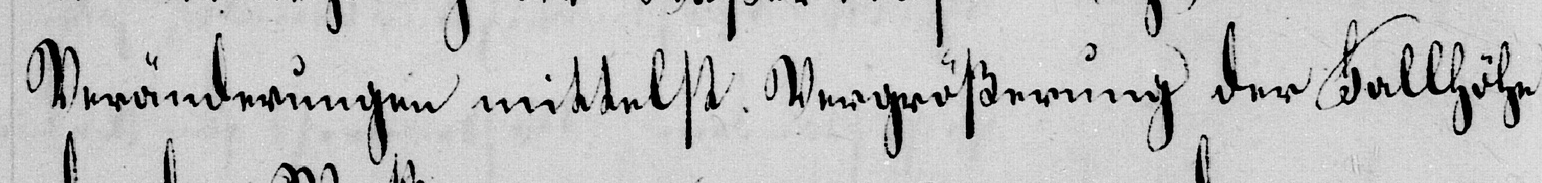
Veränderungen mittelst Vergrößerung der Fallhöhe
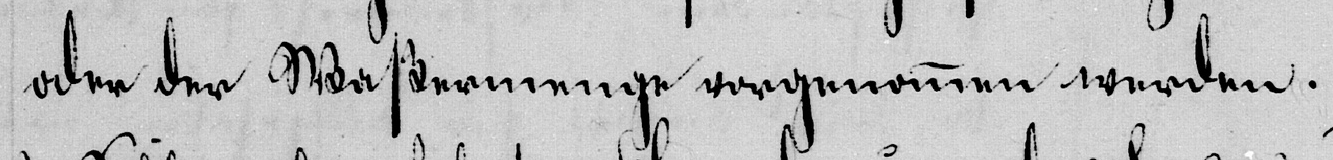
oder der Waßermenge vorgenommen werden.
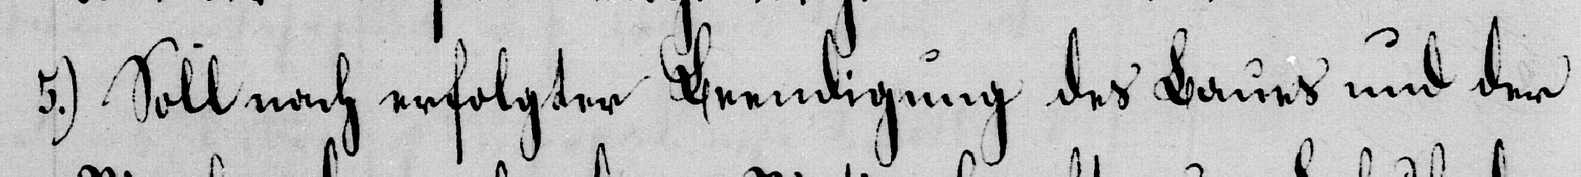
5.) Soll nach erfolgter Beendigung des Baues und der
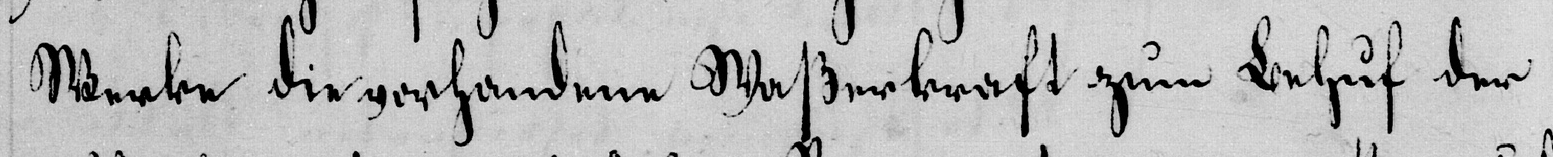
Werke die vorhandene Waßerkraft zum Behuf der
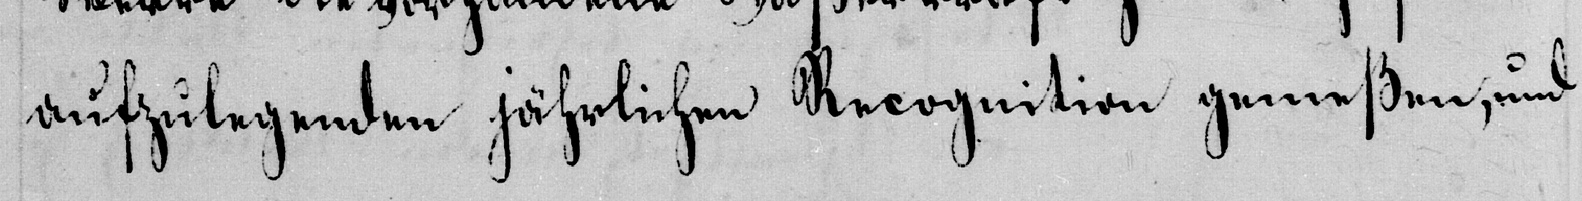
aufzulegenden jährlichen Recognition gemeßen, und
